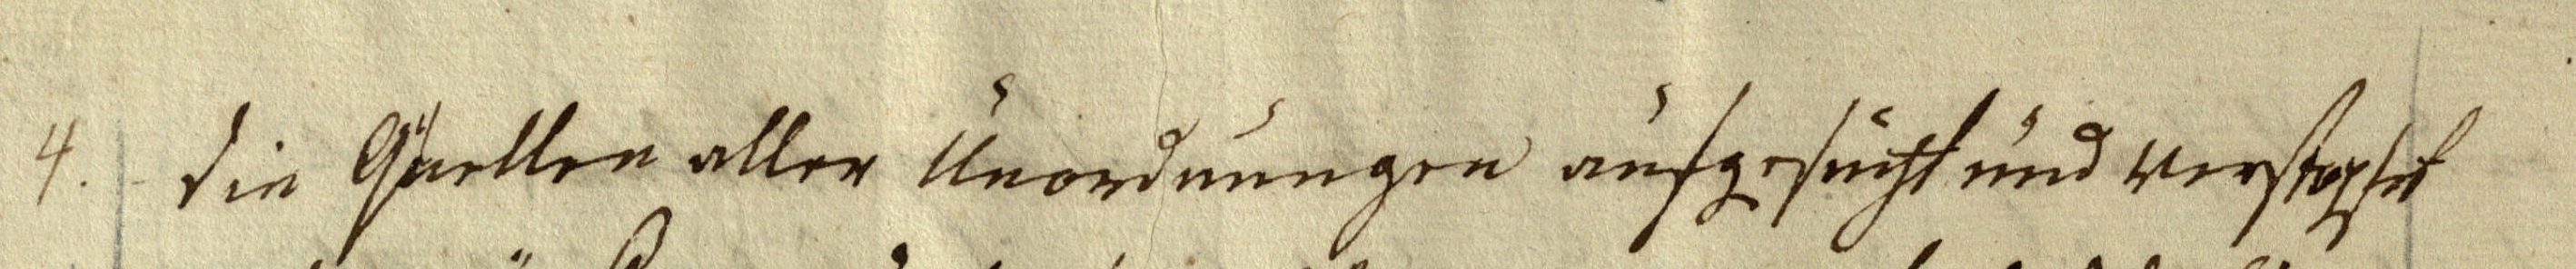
4. die Quellen aller Unordnungen aufgesucht und verstopfet
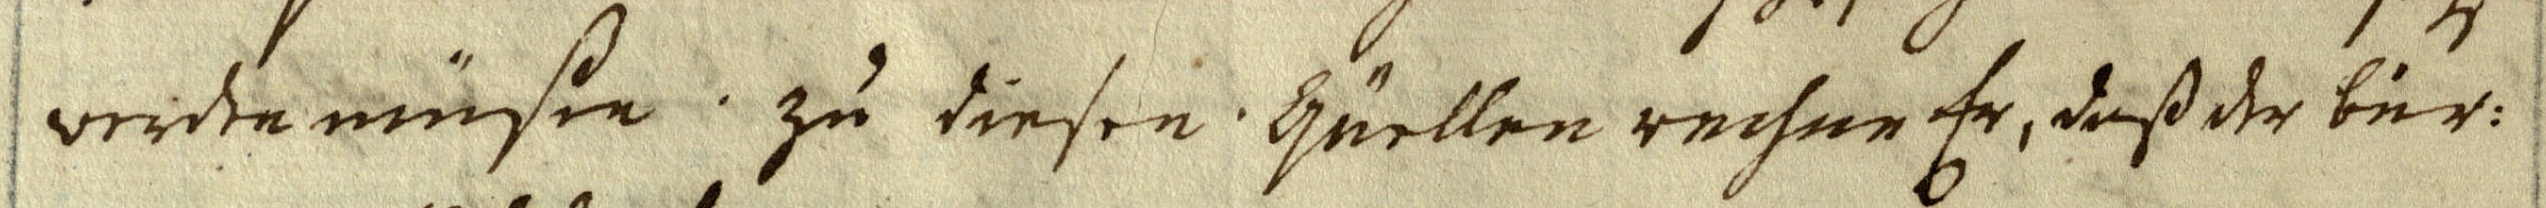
werden müßen. zu diesen Quellen rechne Er, daß der bür¬
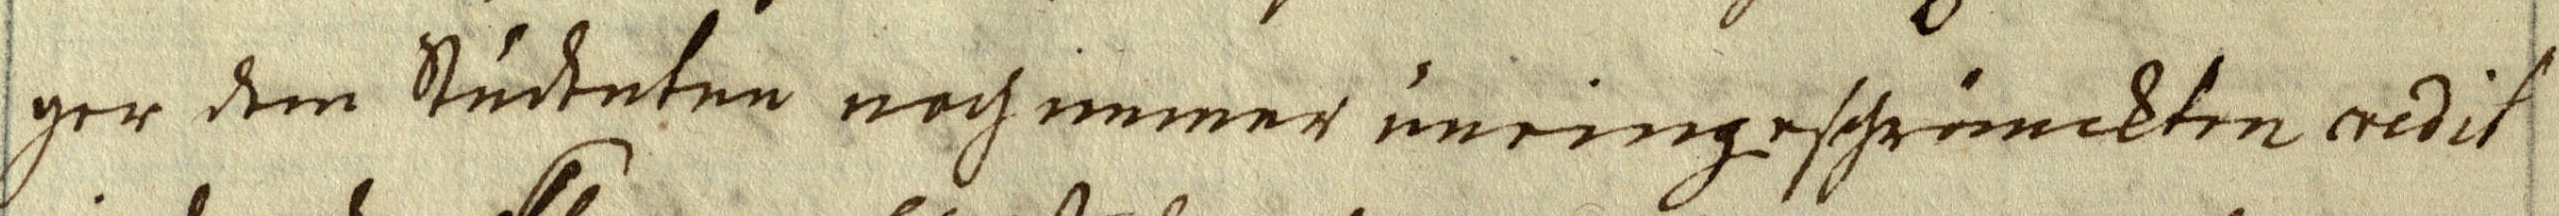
ger dem Studenten noch immer uneingeschränckten credit
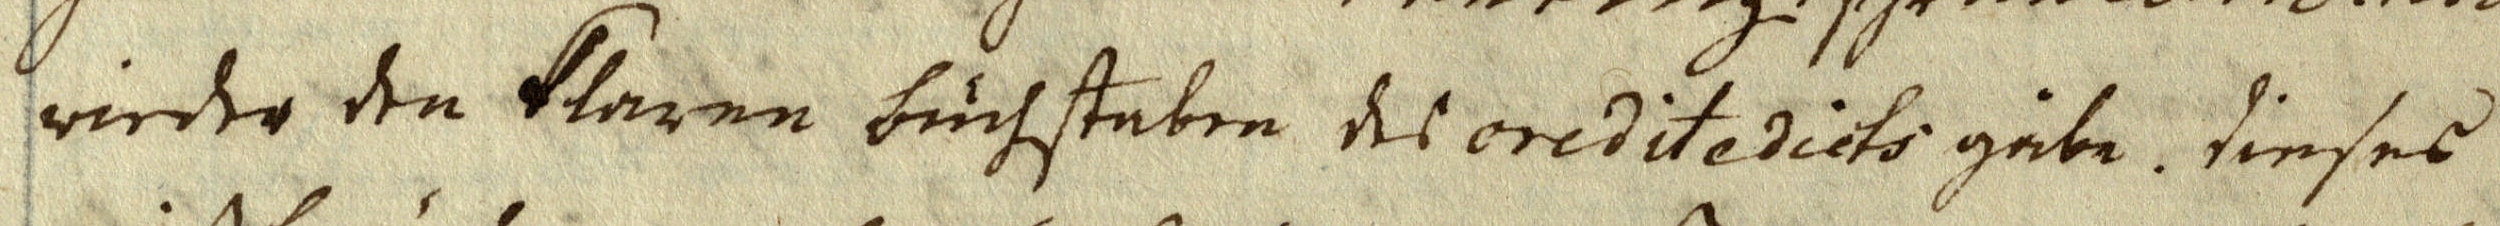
wieder den klaren Buchstaben des creditedicts gäbe. dieses
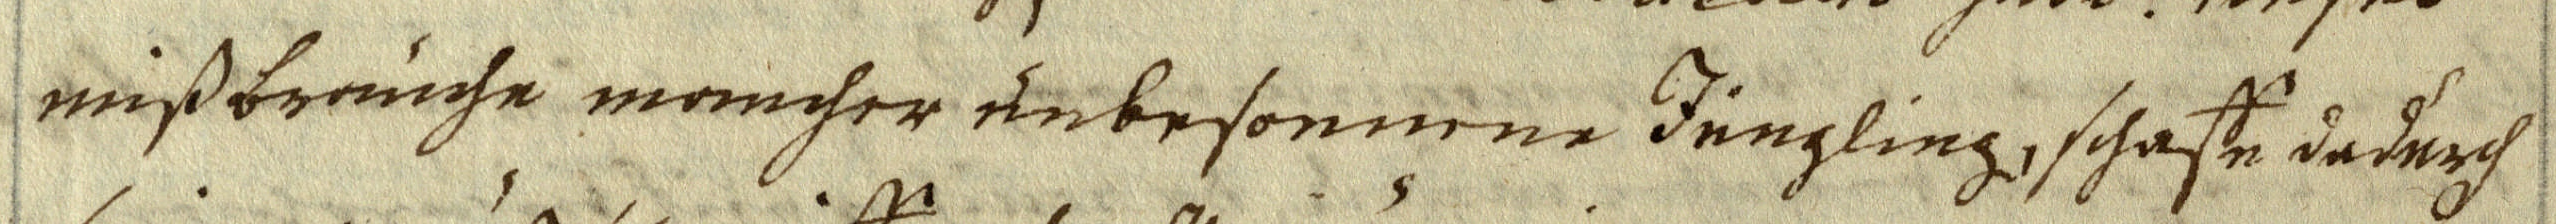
mißbrauche mancher unbesonnene Jüngling, schaffe dadurch
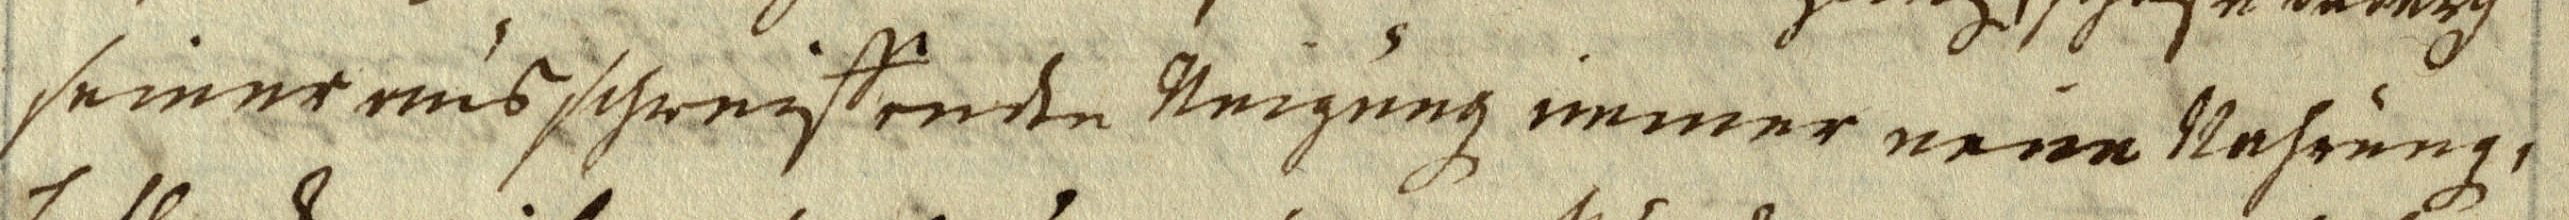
seiner ausschweiffenden Neigung immer neue Nahrung,
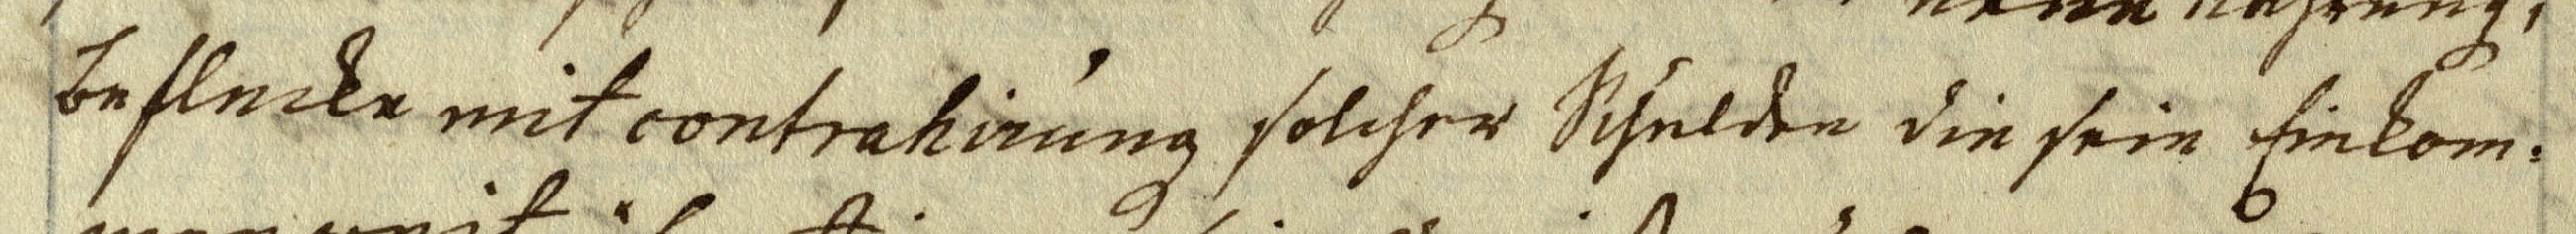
beflecke mit contrahirung solcher Schulden die sein Einkom¬
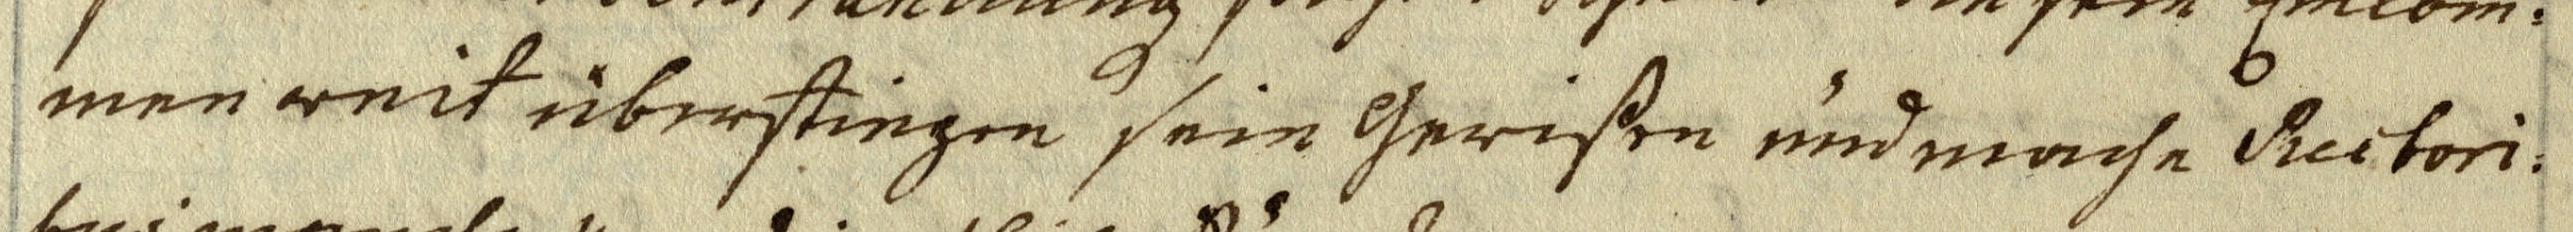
men weit überstiegen sein Gewißen und mache Rectori¬
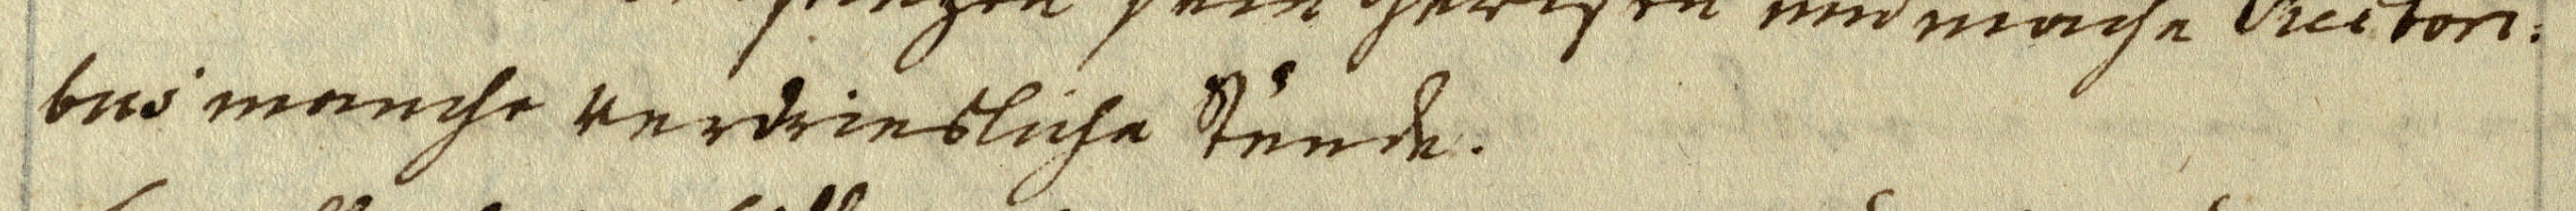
bus manche verdriesliche Stunde.
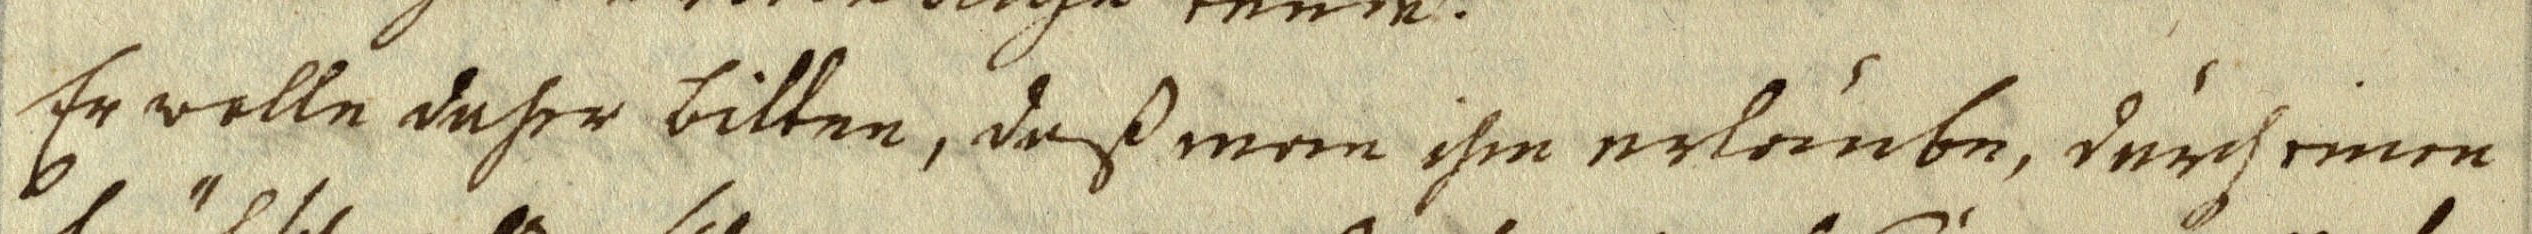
Er wolle daher bitten, daß man ihm erlaube, durch einen
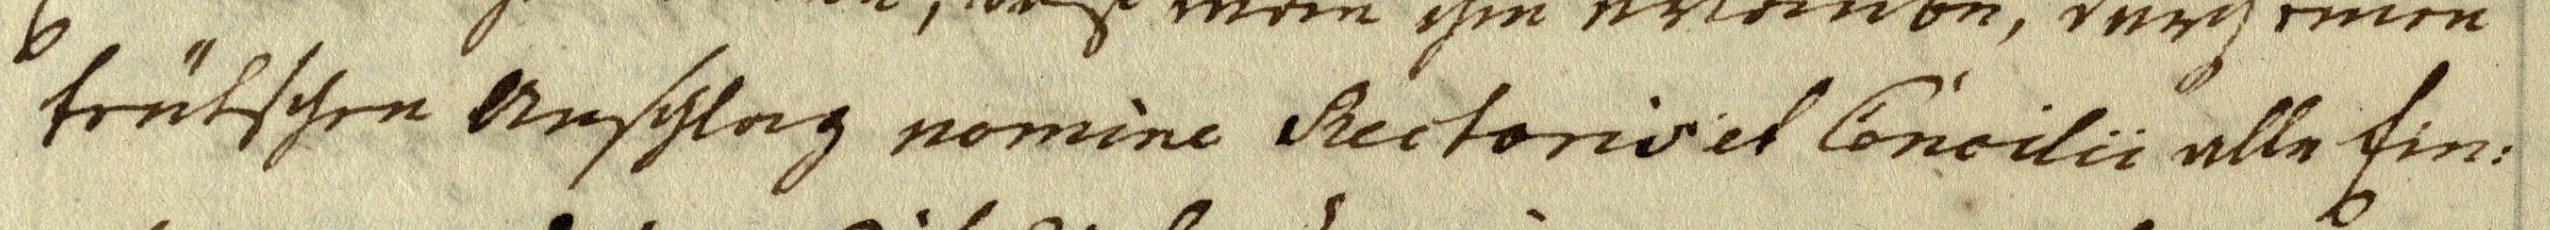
teutschen Anschlag nomine Rectoris et Concilii alle Ein¬
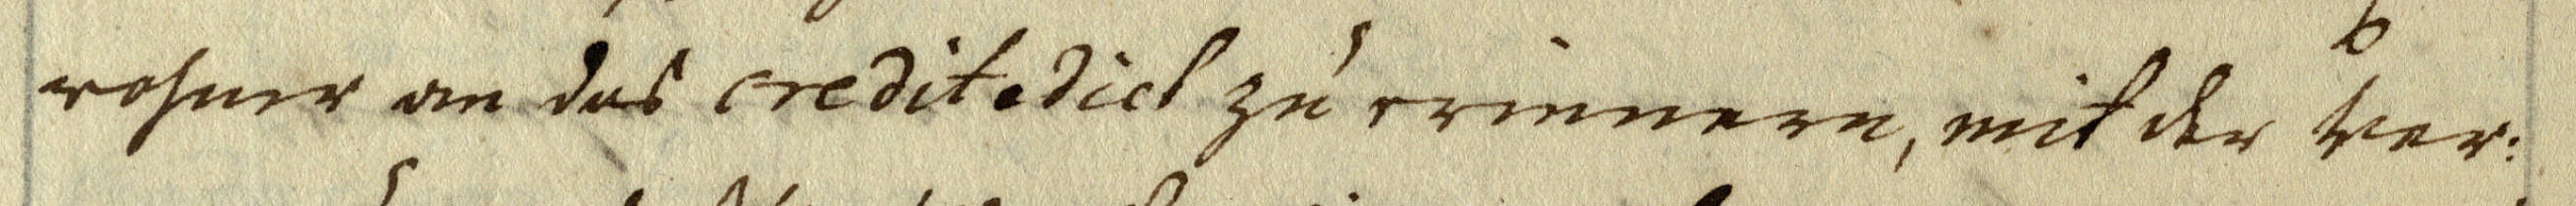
wohner an das creditedict zu erinnern, mit der Ver¬
